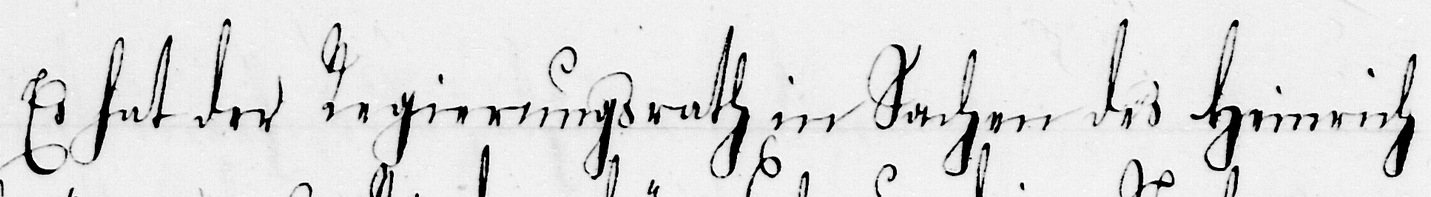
Es hat der Regierungsrath in Sachen des Heinrich
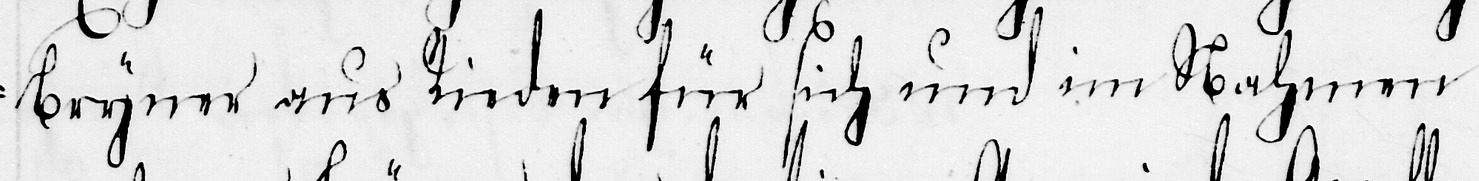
Bryner aus Rieden für sich und im Nahmen
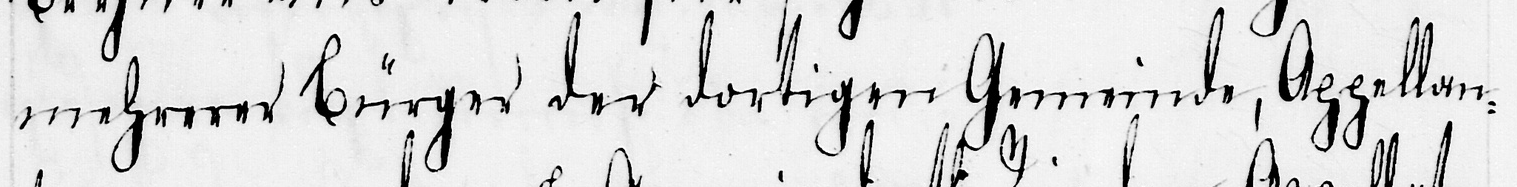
mehrerer Bürger der dortigen Gemeinde, Appellan¬
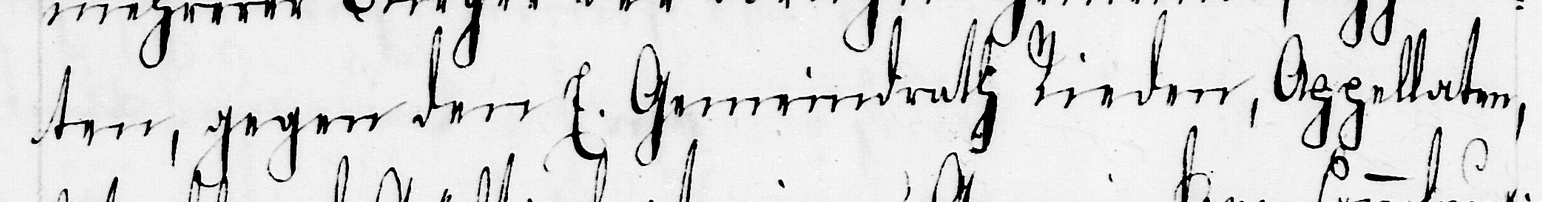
ten, gegen den E. Gemeindrath Rieden, Appellaten,
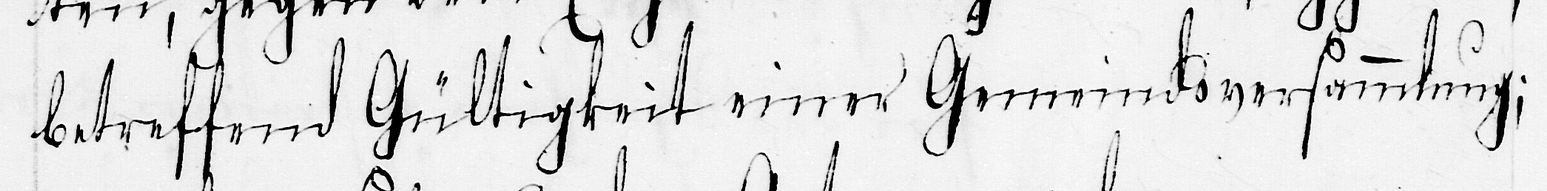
betreffend Gültigkeit einer Gemeindsversammlung;
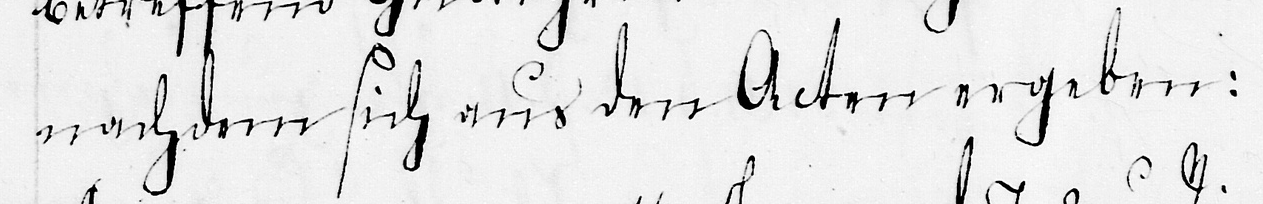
nachdem sich aus den Acten ergeben:
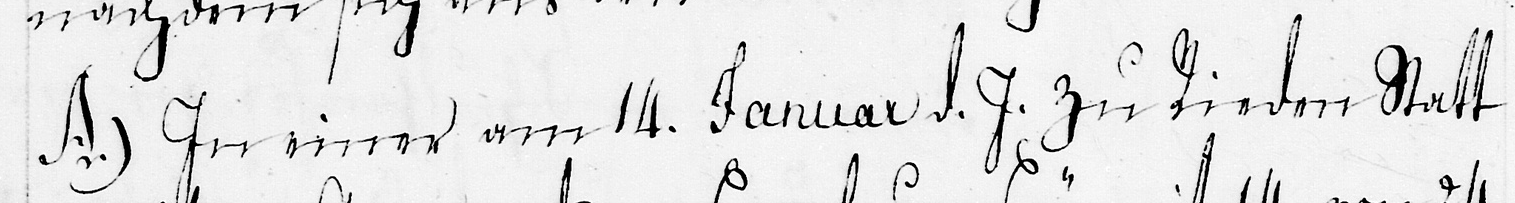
A.) In einer am 14. Januar d. J. zu Rieden Statt
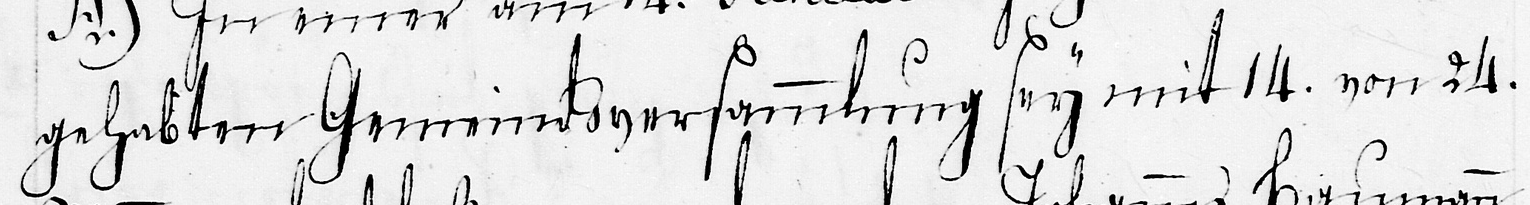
gehabten Gemeindsversammlung sey mit 14. von 24.
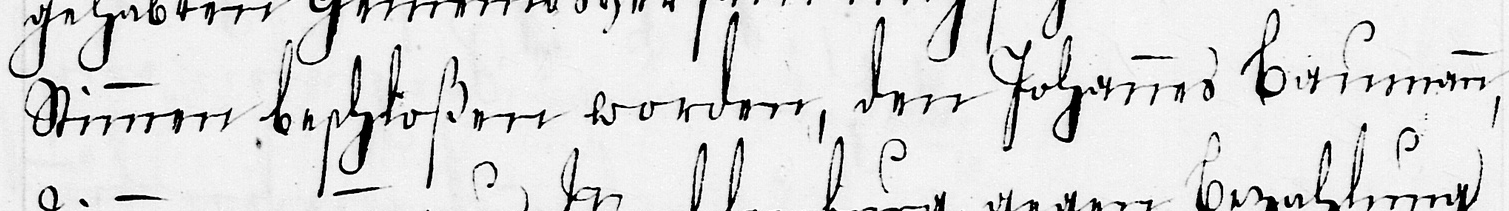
Stimmen beschloßen worden, den Johannes Bauman¬
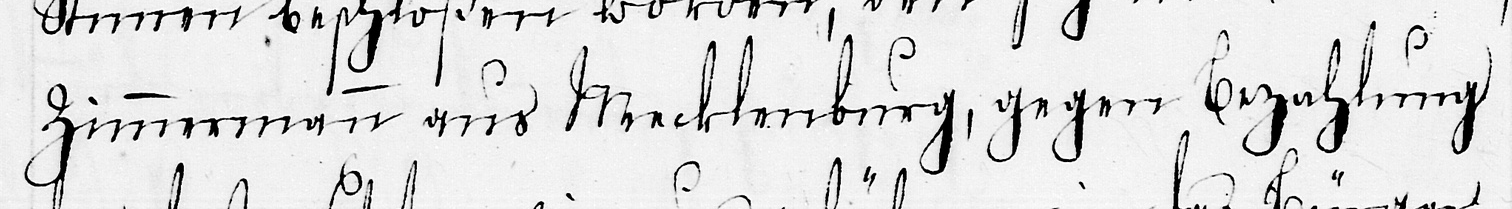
Zimmermann aus Mecklenburg, gegen Bezahlung
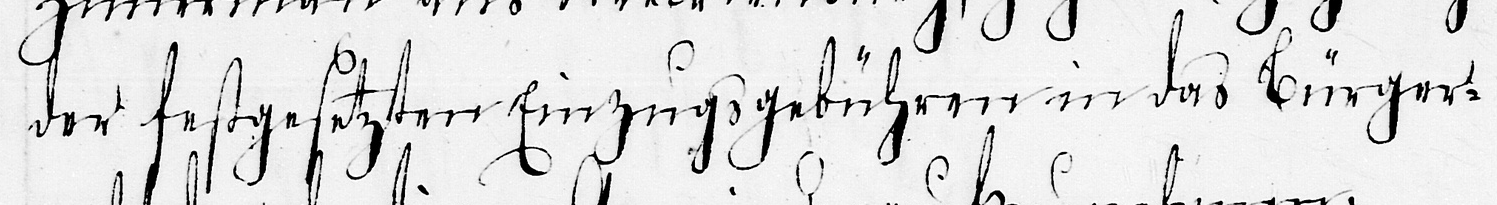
der festgesetzten Einzugsgebühren in das Bürger¬
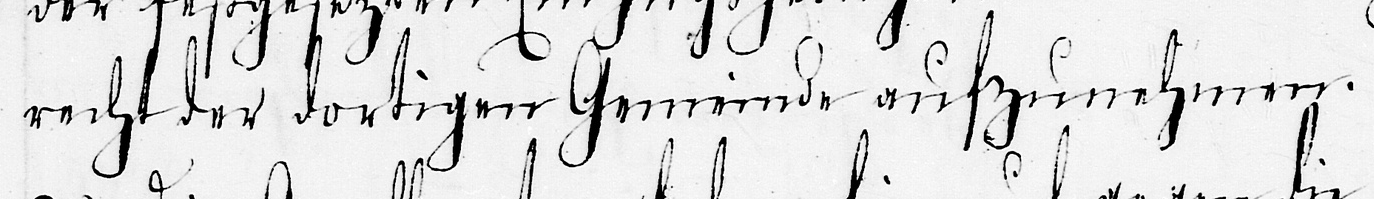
recht der dortigen Gemeinde aufzunehmen.
